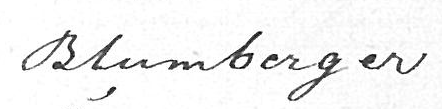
Blumberger
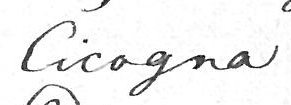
Cicogna
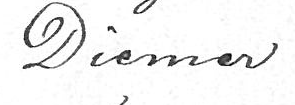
Diemer
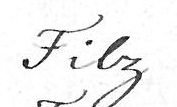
filz
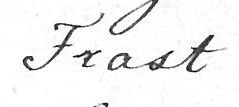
Frost
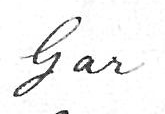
Gar
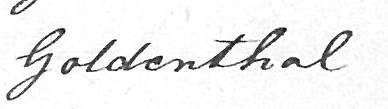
Goldenthal
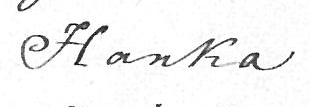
Hanka
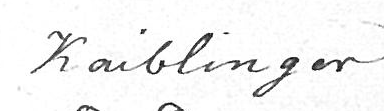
Kaiblinger
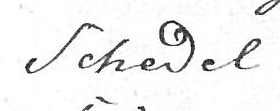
Schedel
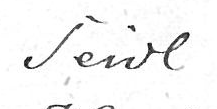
Seidl
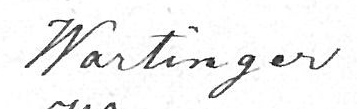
Wartinger
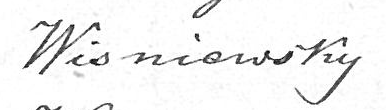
Wisniewsky
